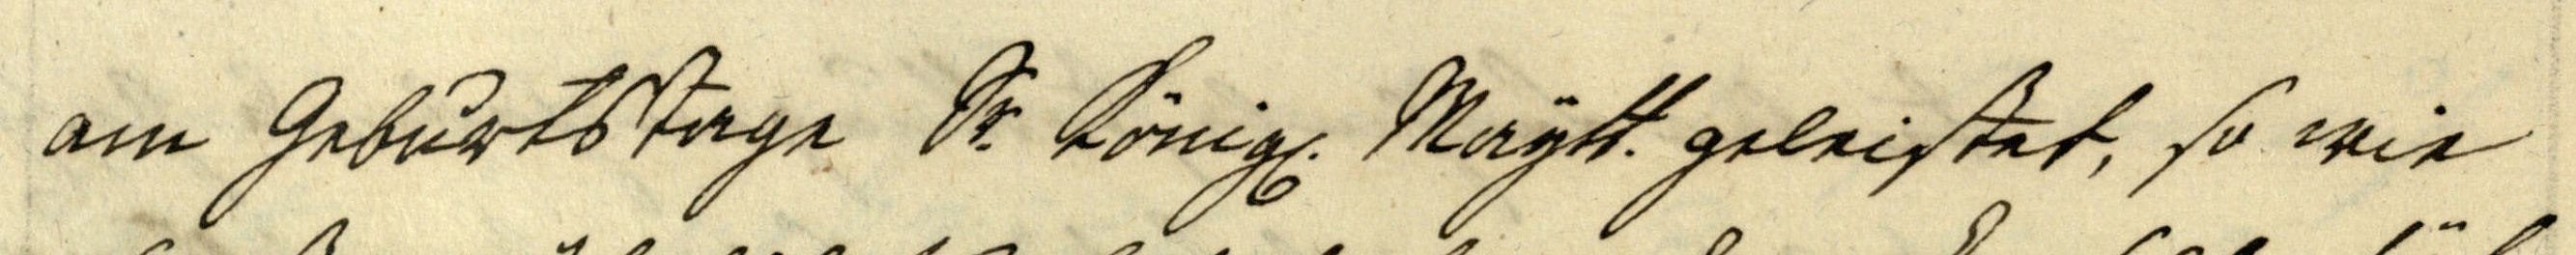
am Geburtstage Sr Königl. Maÿtt. geleistet, so wie
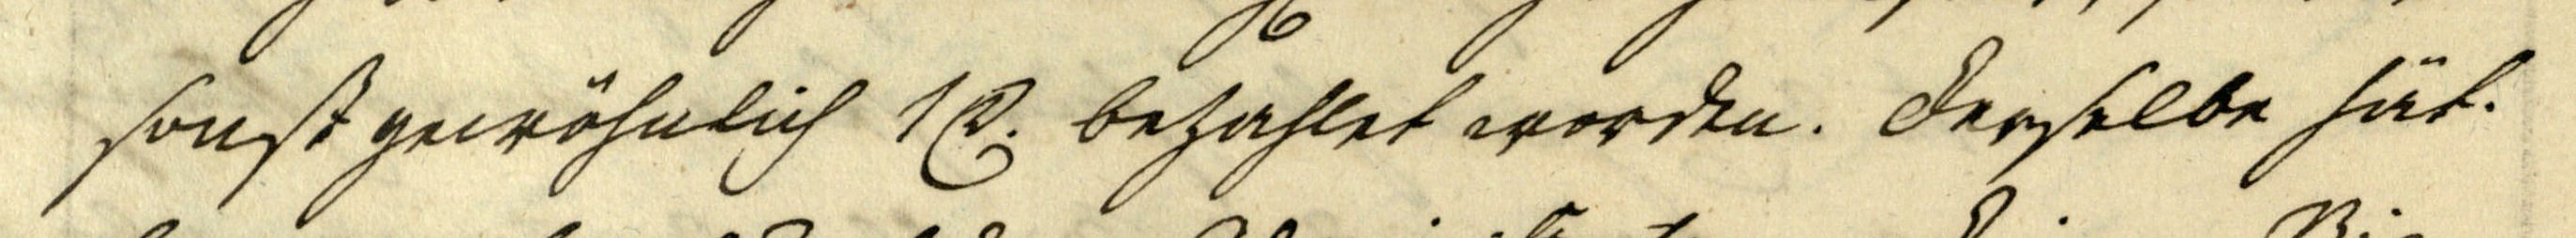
sonst gewöhnlich 1 l. bezahlet worden. Derselbe hät¬
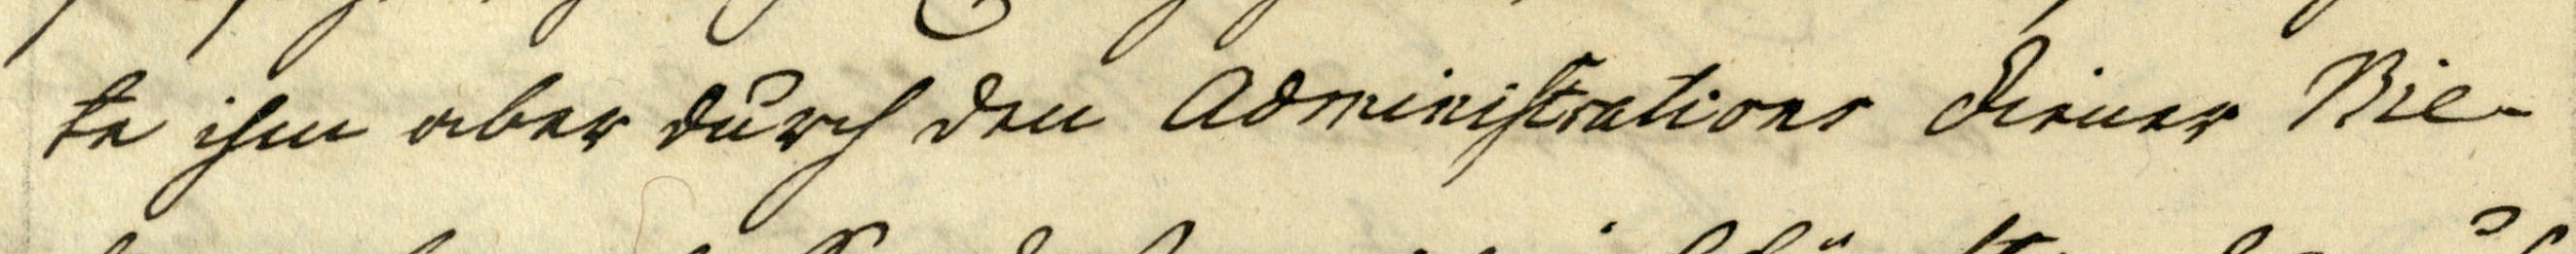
te ihm aber durch den Administrations Diener Bie¬
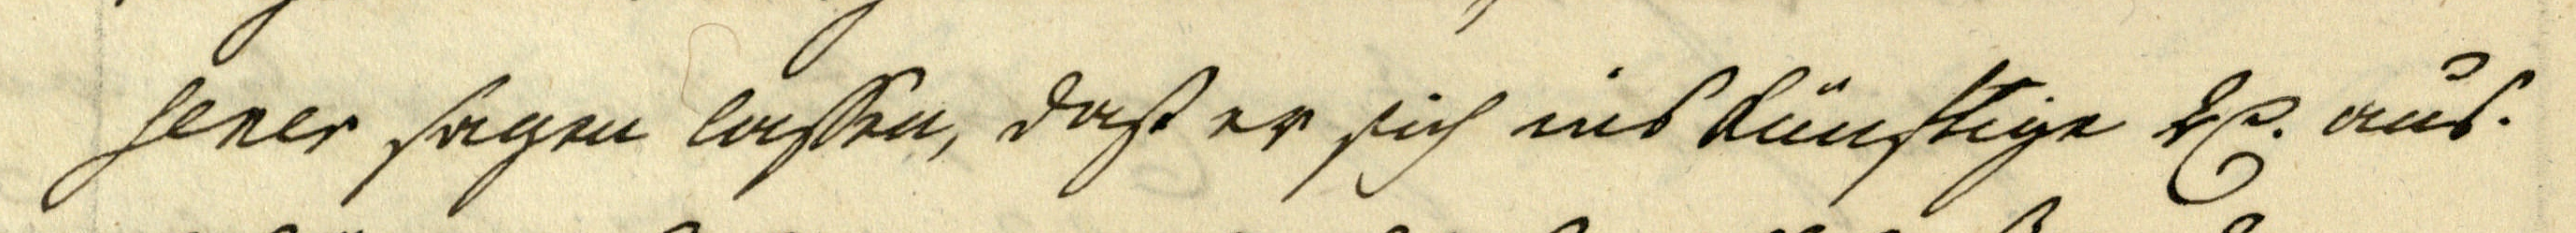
sener sagen lassen, daß er sich ins künftige 2 l. aus¬
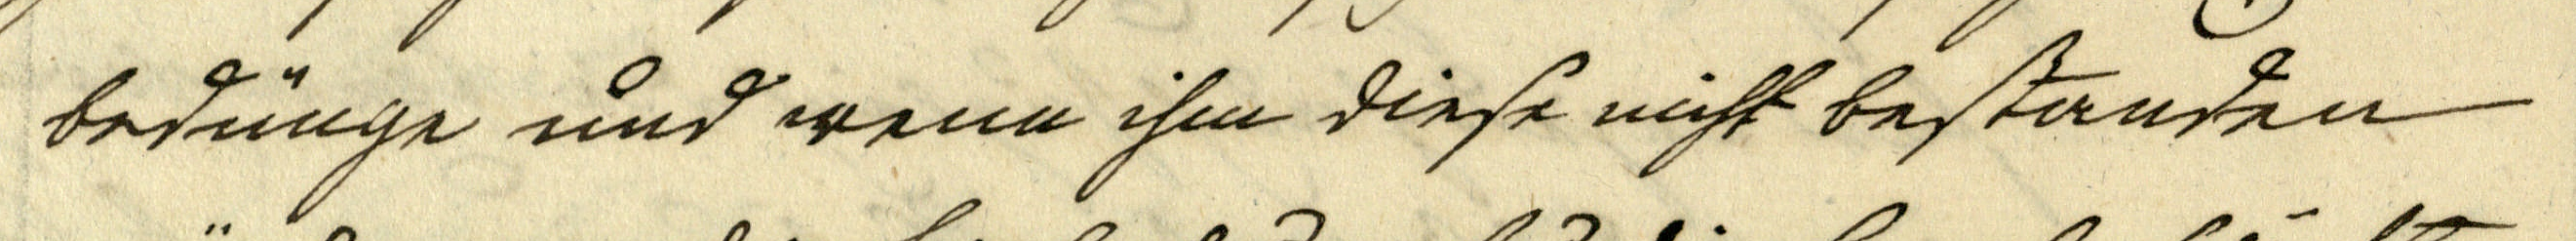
bedünge und wenn ihm diese nicht bestanden
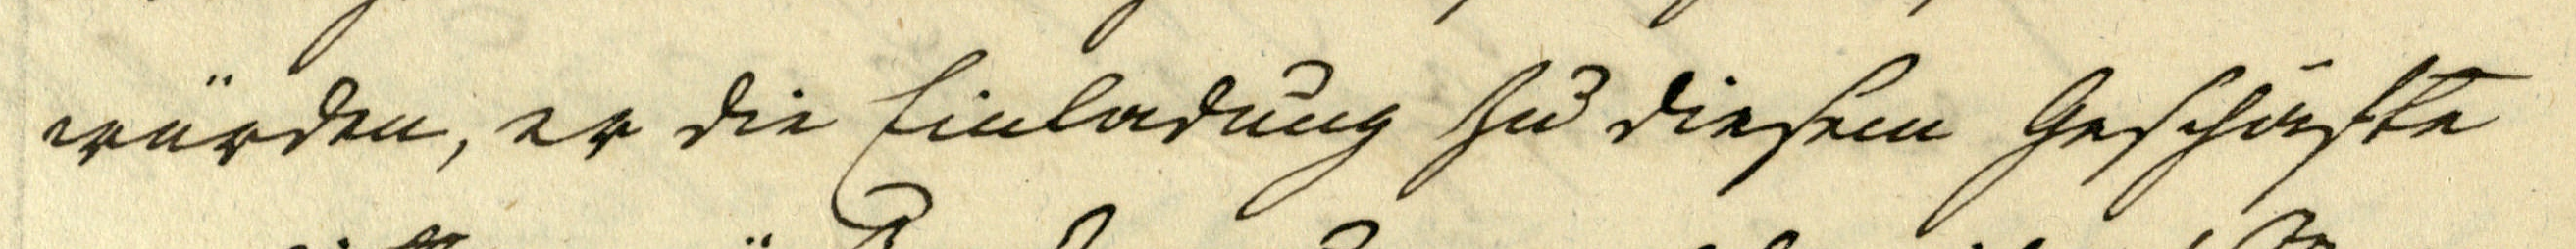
würden, er die Einladung zu diesem Geschäfte
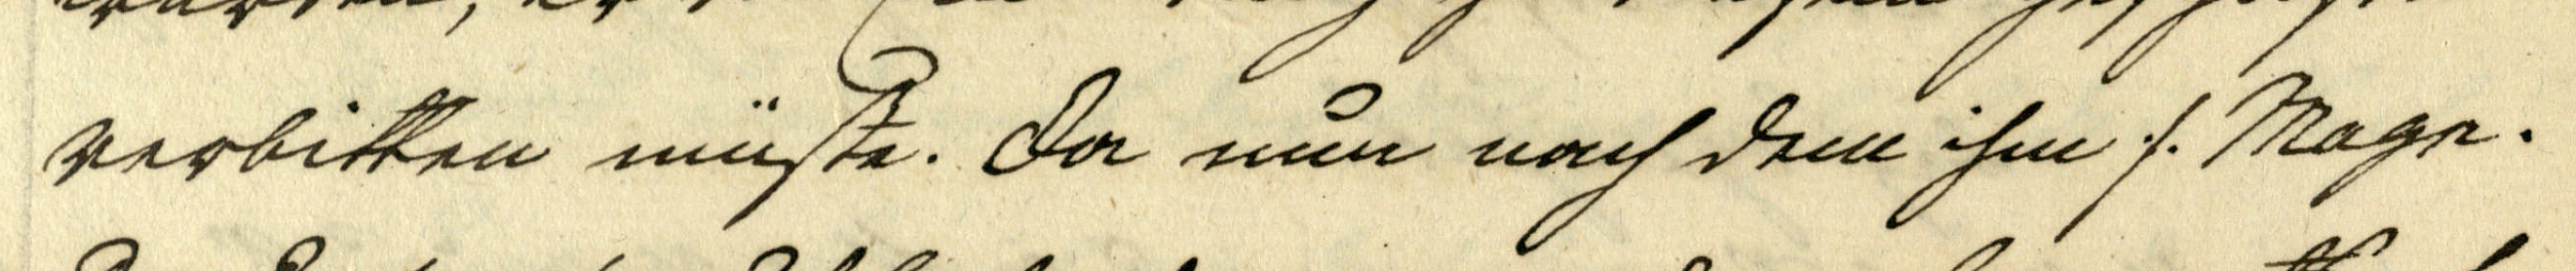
verbitten müßte. Da nun nach dem ihm /. Magn.
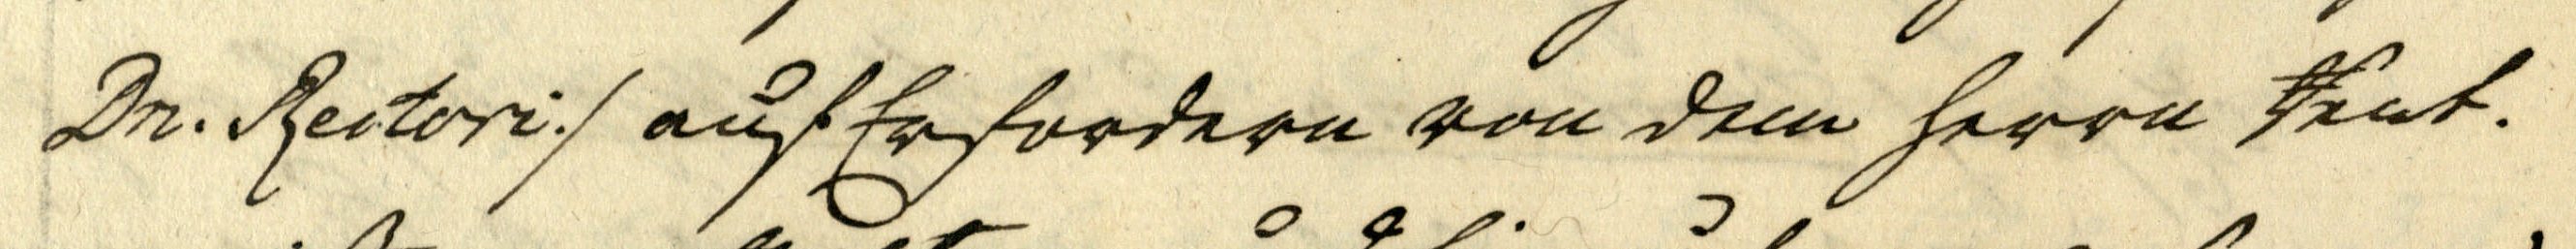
Dn. Rectori ./ auf Erfordern von dem Herrn Rent¬
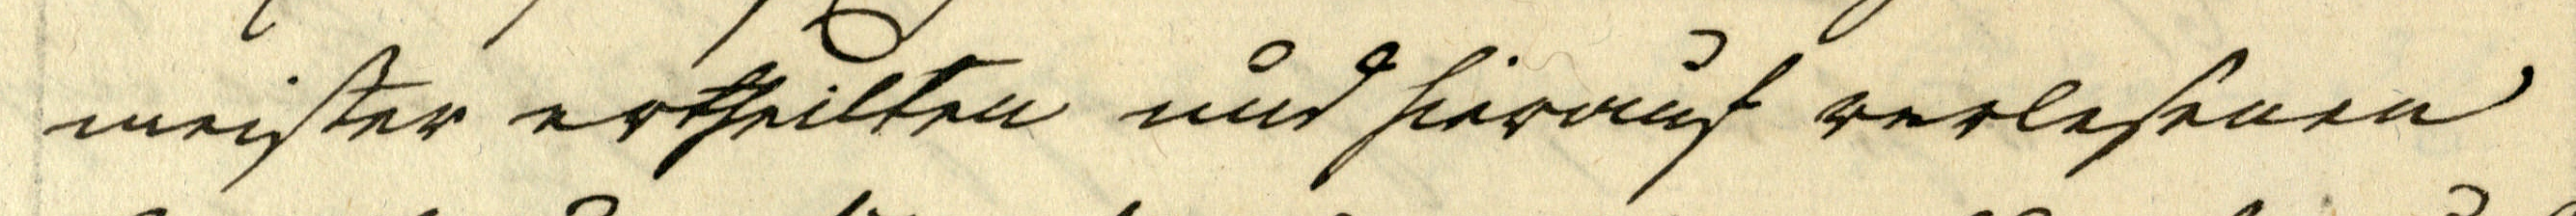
meister ertheilten und hierauf verlesenen
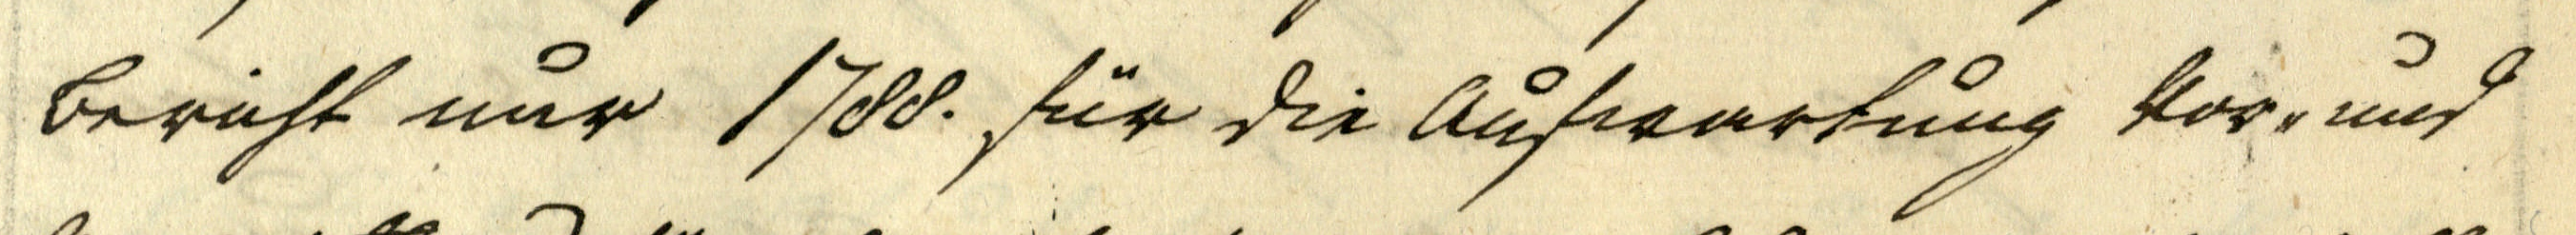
Bericht nur 1788. für die Aufwartung Vor- und
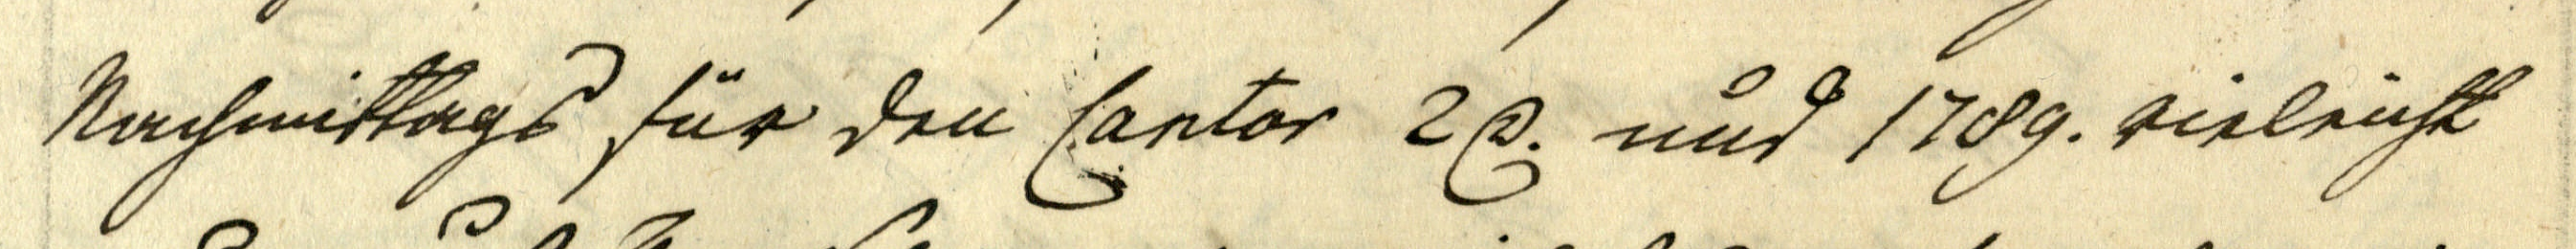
Nachmittags für den Cantor 2 l. und 1789. vieleicht
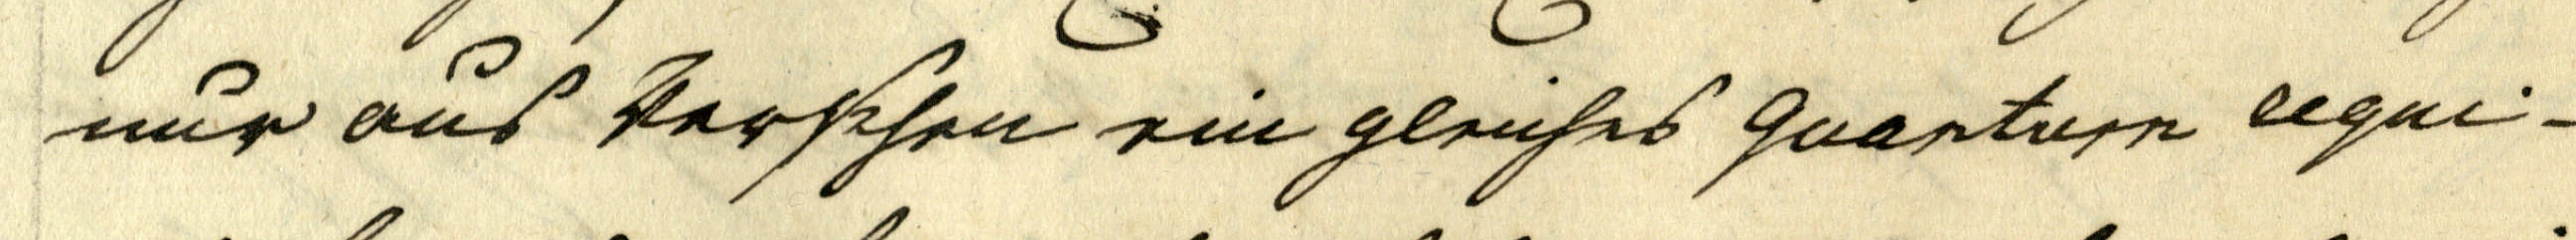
nur aus Versehen ein gleiches Quantum requi¬
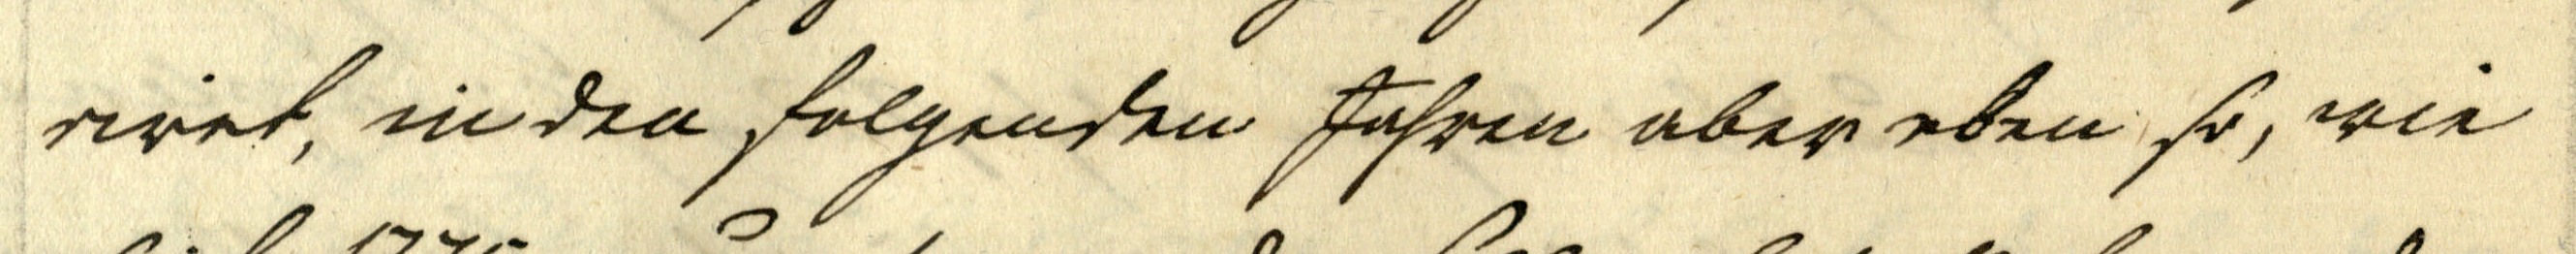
riret, in den folgenden Jahren aber eben so, wie
